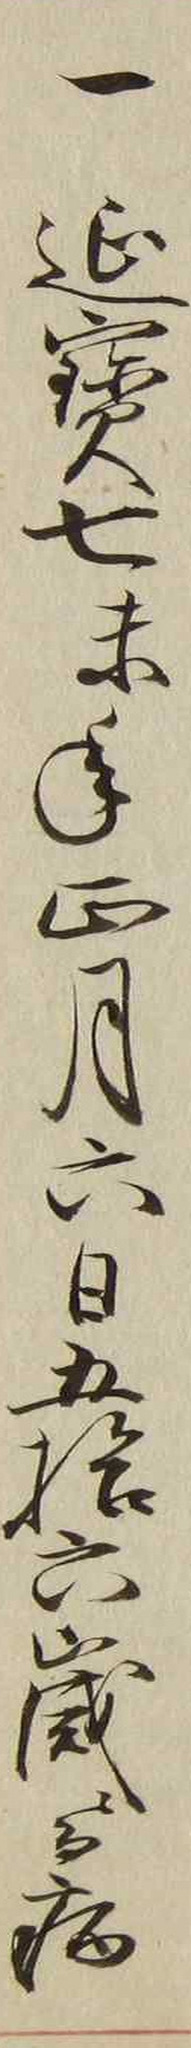一延宝七未年正月六日五拾六歳に而病

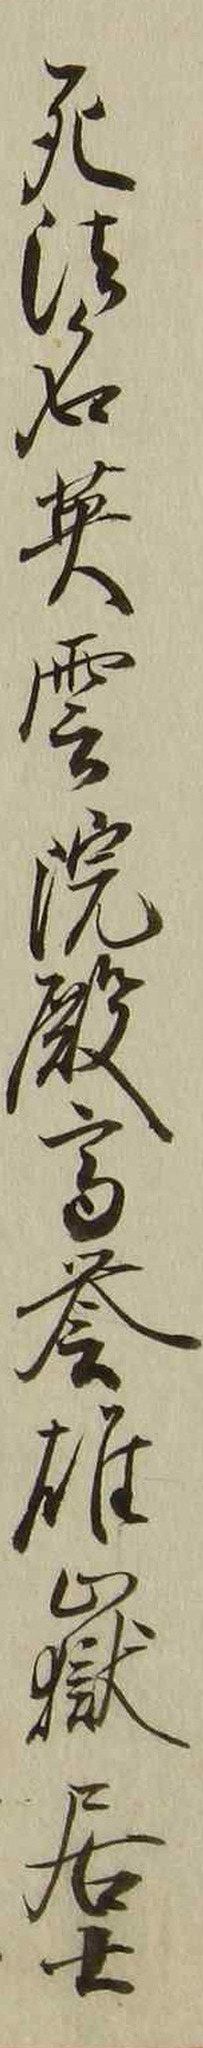死法名英雲院殿高誉雄岳居士
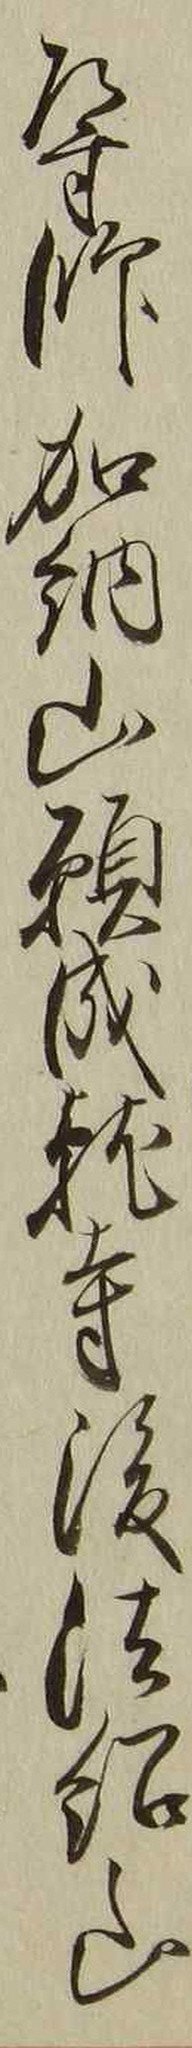導師加納山願成就寺後法紹山
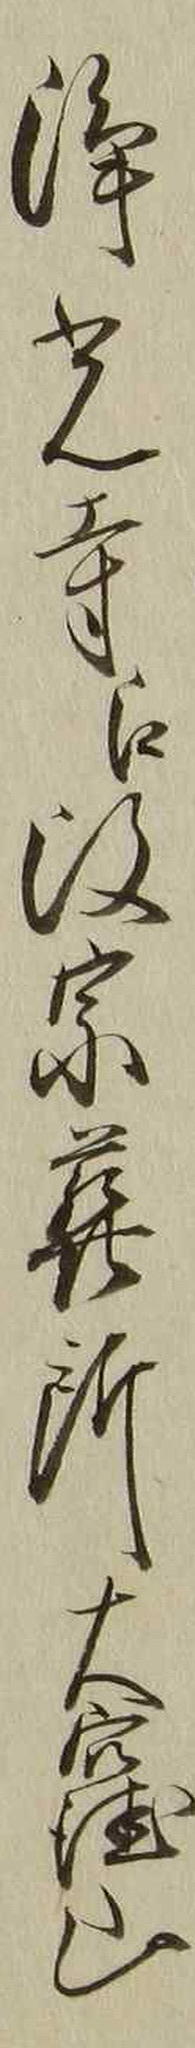浄光寺改宗葬所大窪山
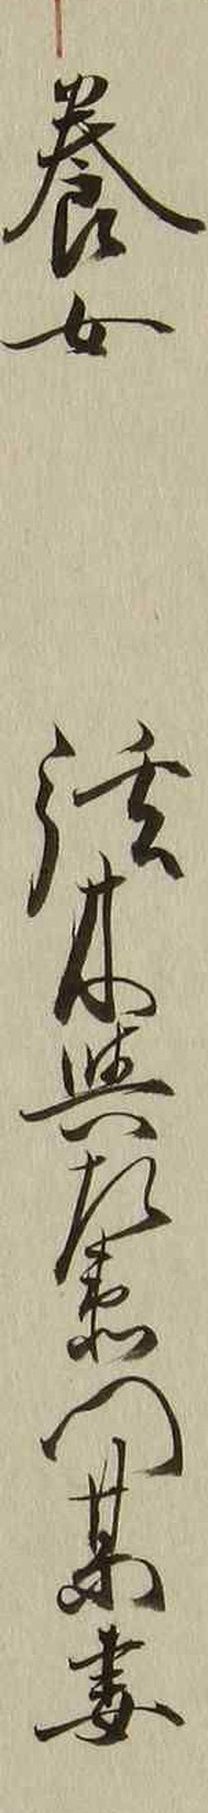養女弦木輿左衛門某妻
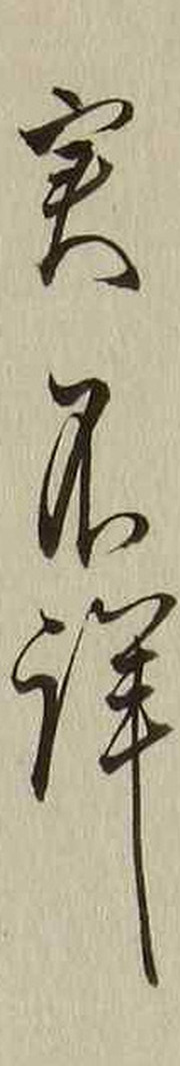実不詳
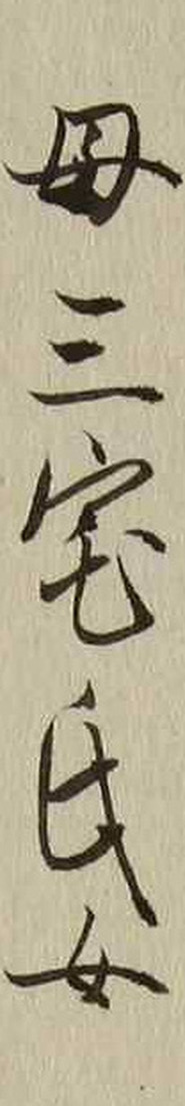母三宅氏女
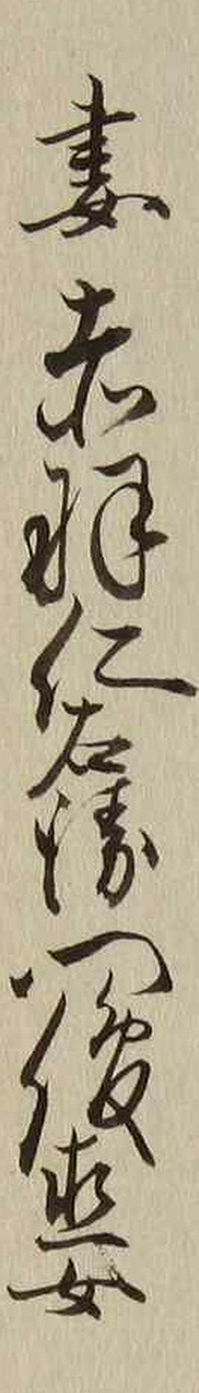妻赤羽仁右衛門俊直女
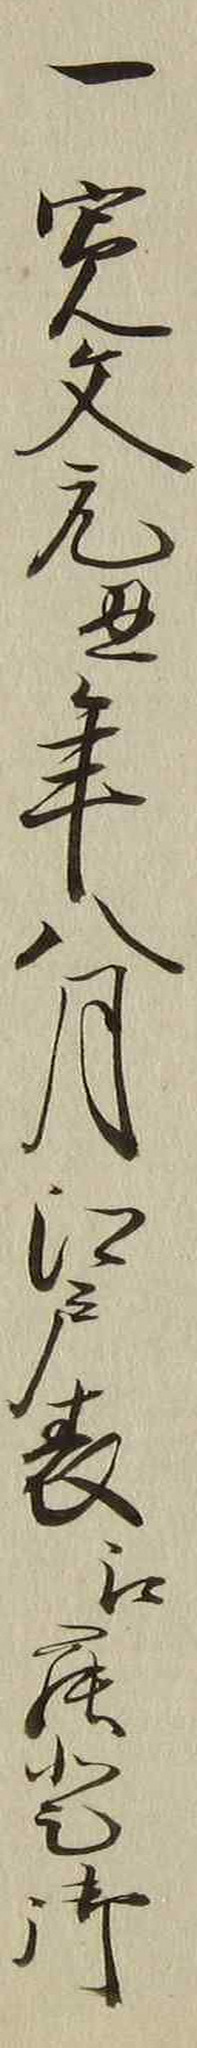一寛文元丑年八月江戸表江罷登御
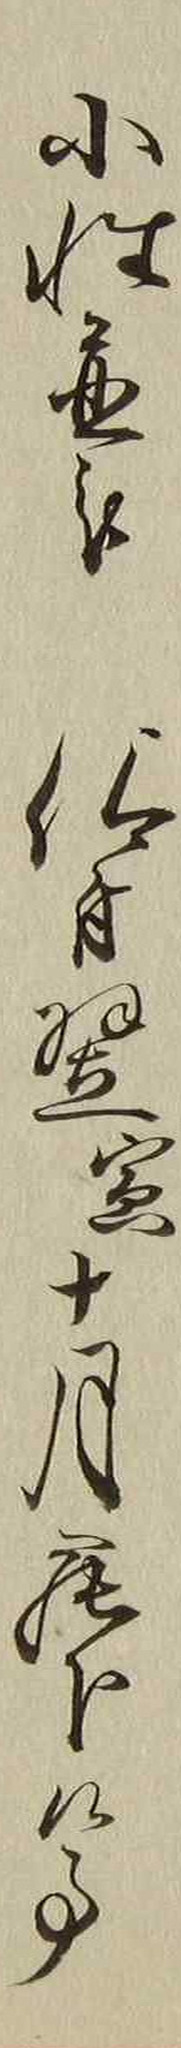小性並被仰付翌寅十月罷下候事
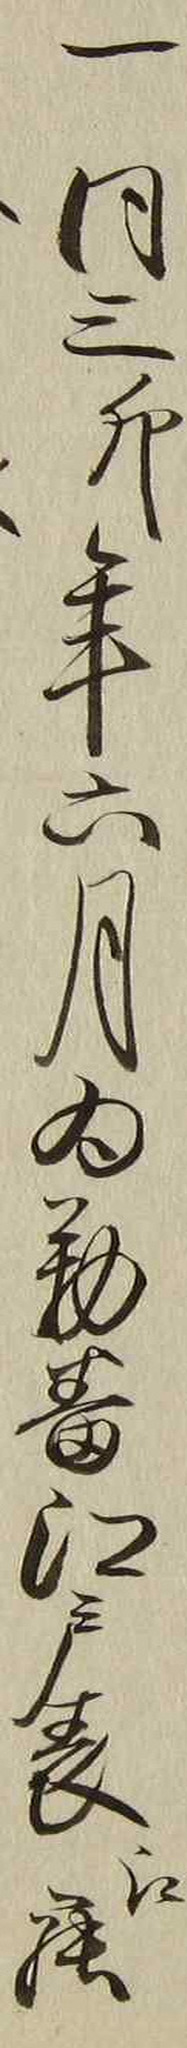一月三卯年六月為勤番江戸表江罷
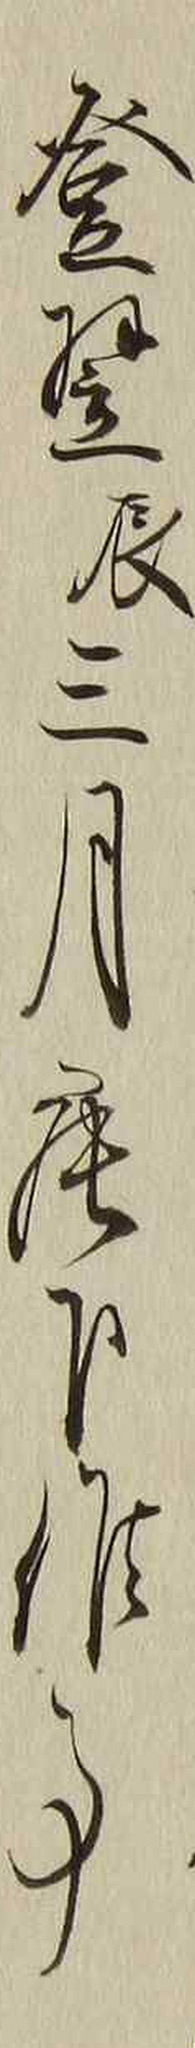登翌辰三月罷下候事
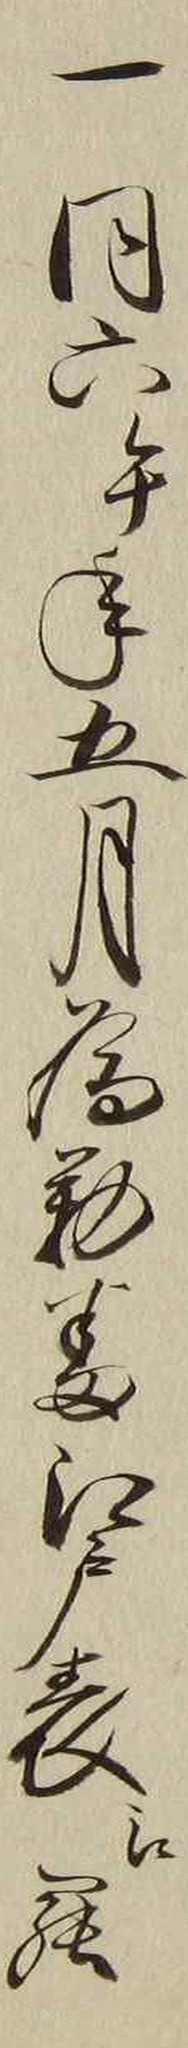一同六午年五月為勤番江戸表江罷
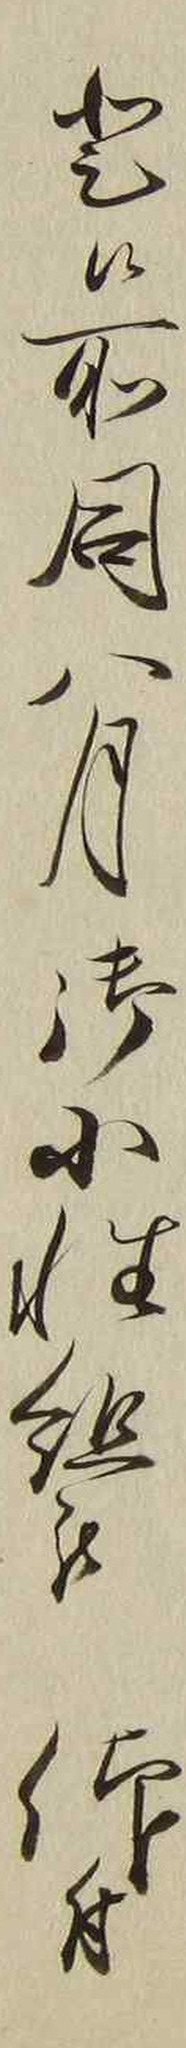登候所同八月御小性組被仰付
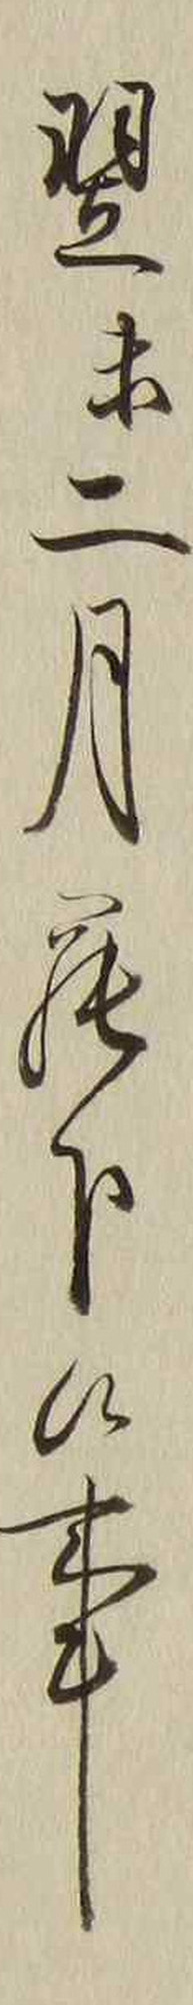翌未二月罷下候事
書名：諸士系譜　巻之77　を之部11
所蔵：会津若松市立会津図書館
